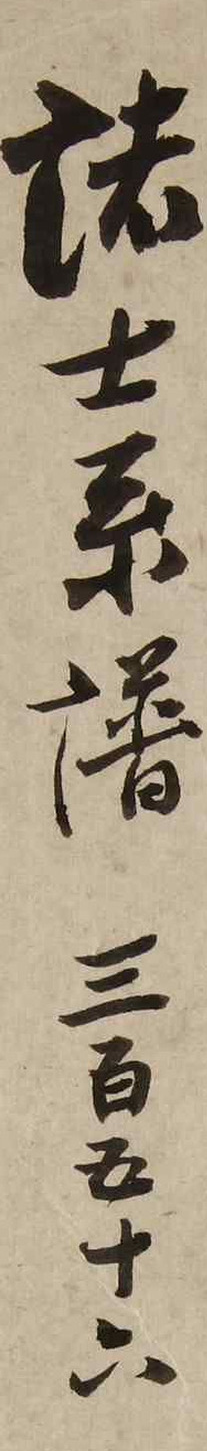諸士系譜三百五十六

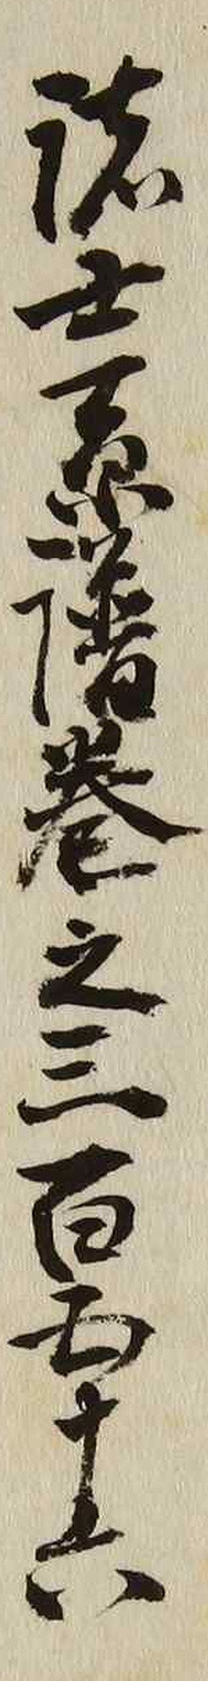諸士系譜巻之三百五十六
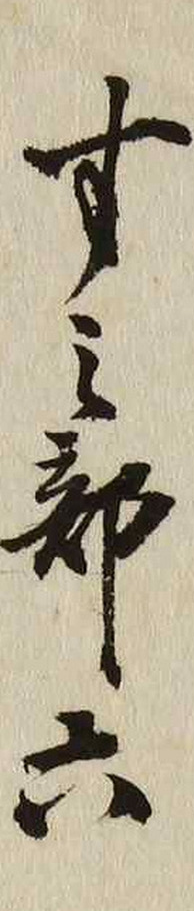す之部六
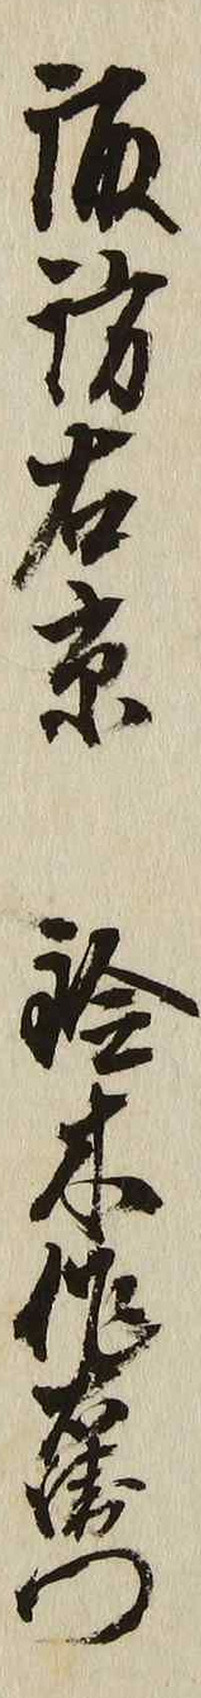諏訪右京鈴木作右衛門
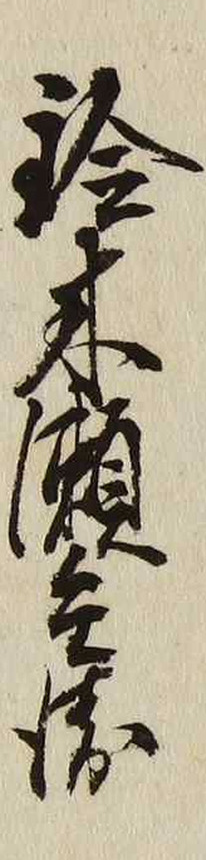鈴木瀬兵衛

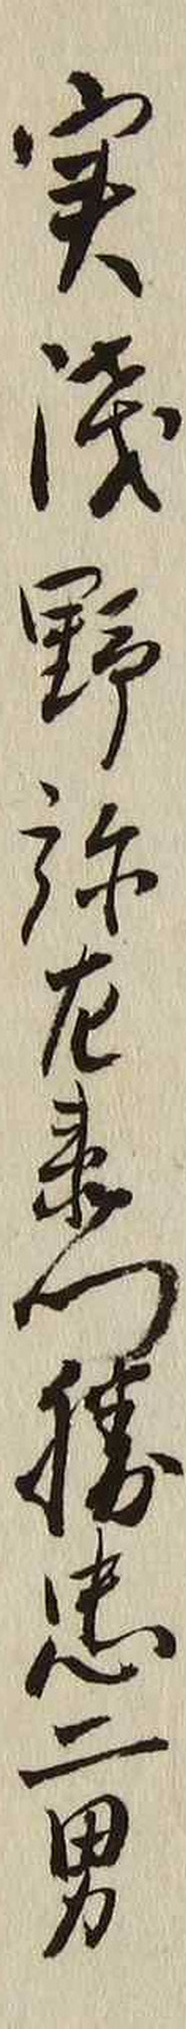実浅野弥左衛門勝忠二男
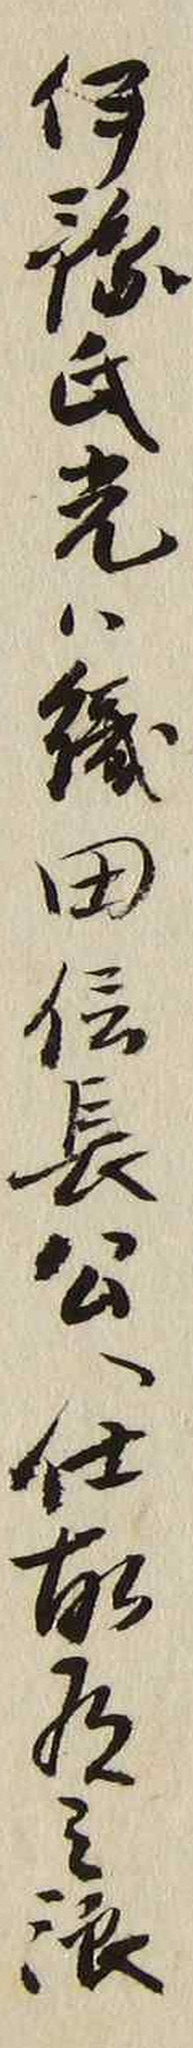伊予氏光ハ織田信長公へ仕故有之浪
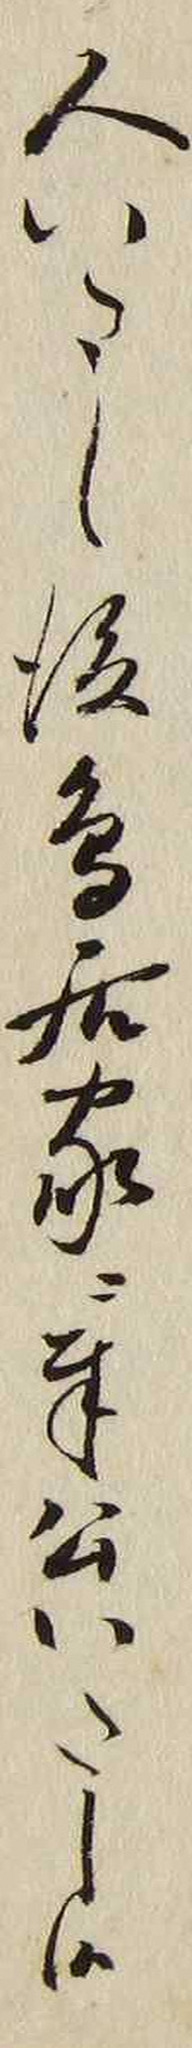人いたし後鳥居家ニ奉公いたし候

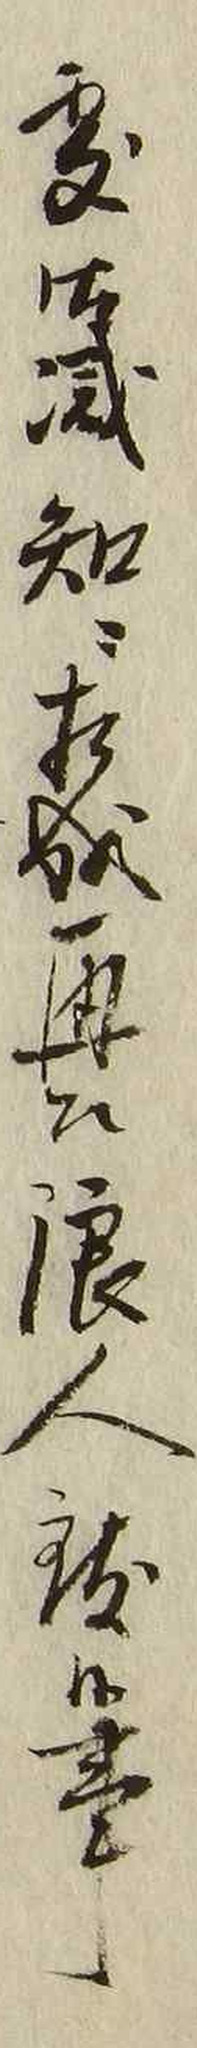処御減知ニ相成再ひ浪人致候事
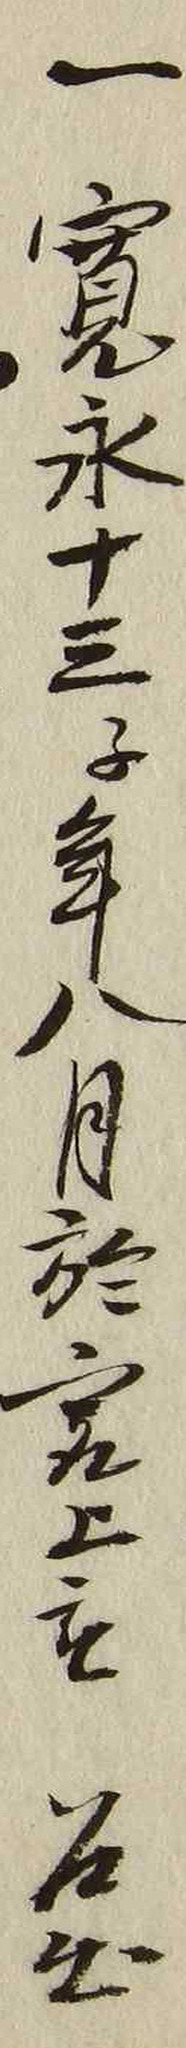一寛永十三子年八月於最上被召出
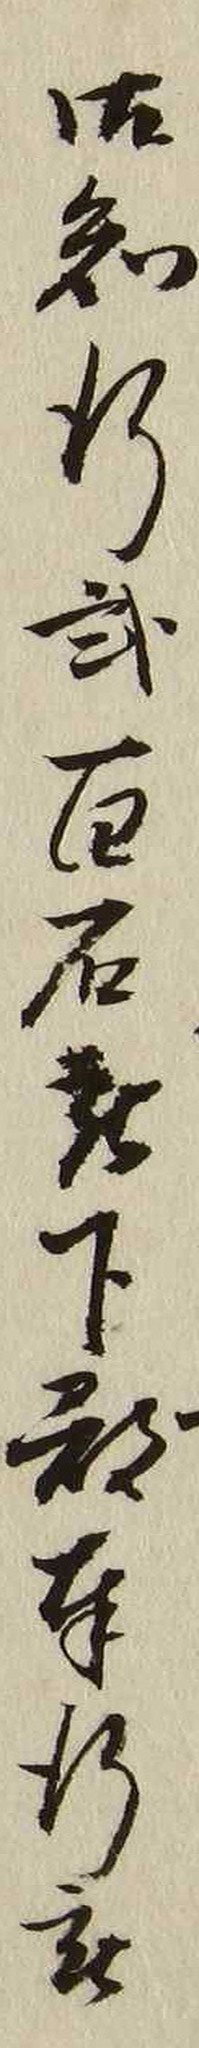御知行弐百石被下郡奉行被
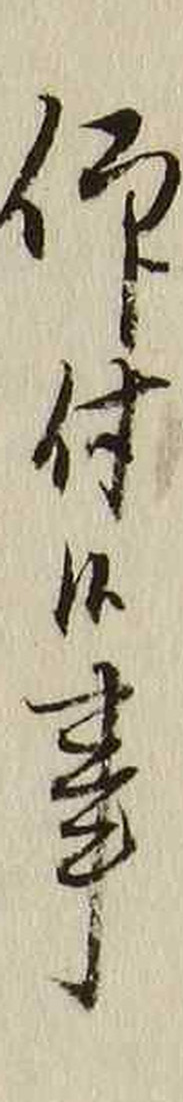仰付候事
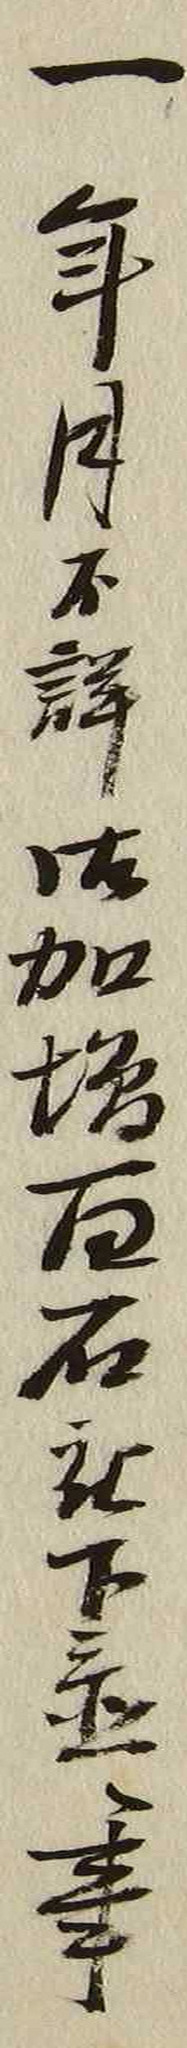一年月不詳御加増百石被下置候事
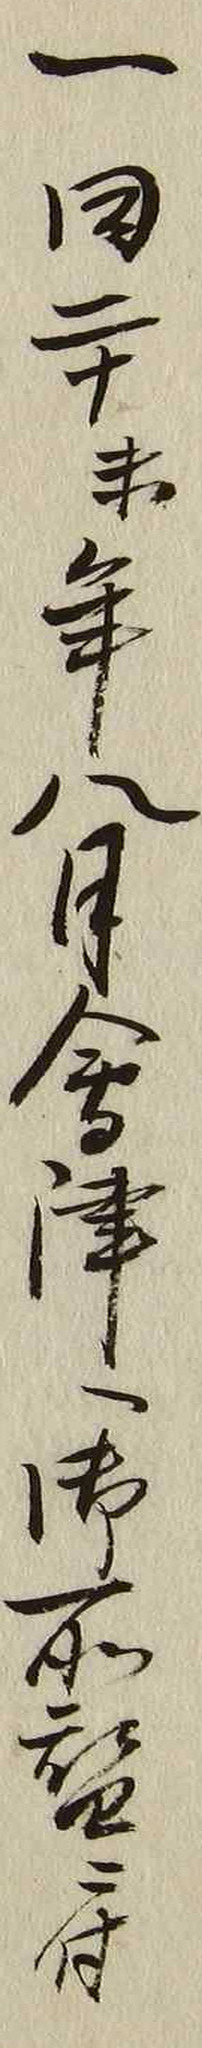一同二十未年八月会津へ御所替ニ付
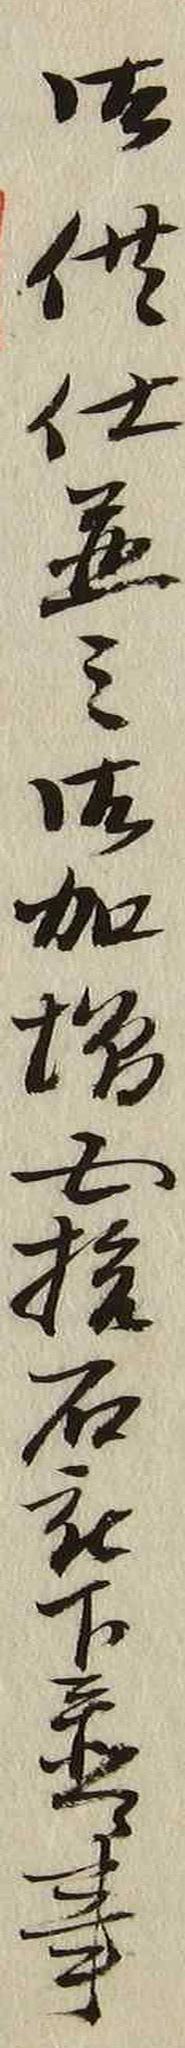御供仕並之御加増五拾石被下置候事
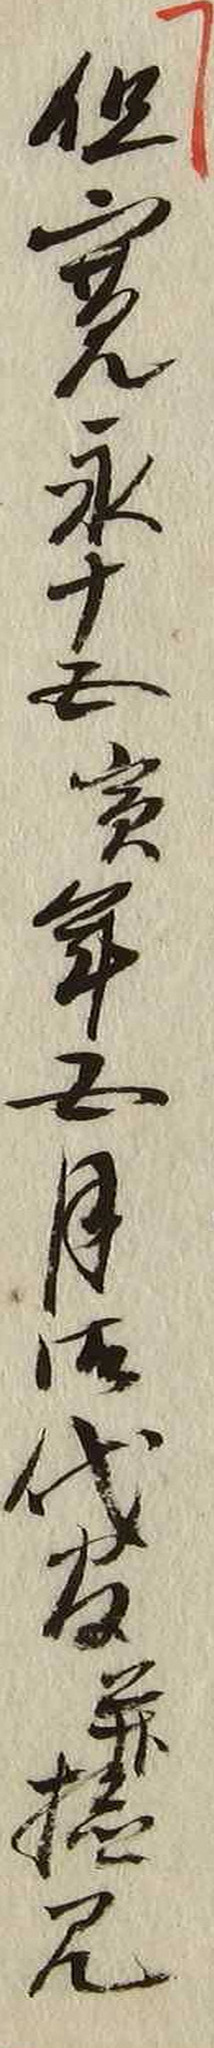但寛永十五寅年五月御代官并検見
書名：諸士系譜　巻之356　す之部6
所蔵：会津若松市立会津図書館
